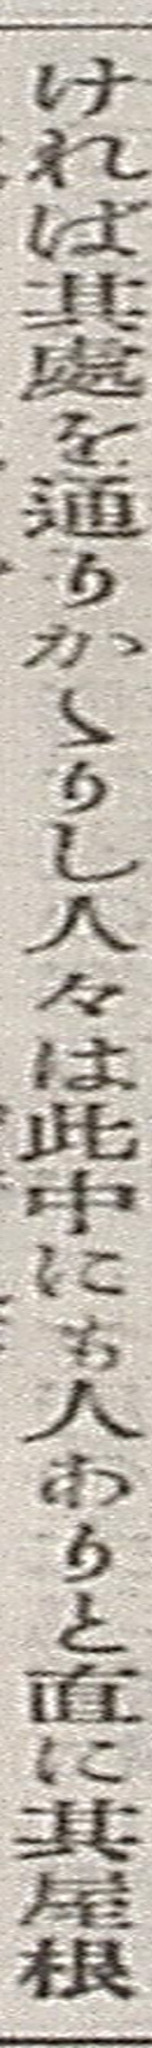ければ其処を通りかゝりし人々は此中にも人ありと直に其屋根
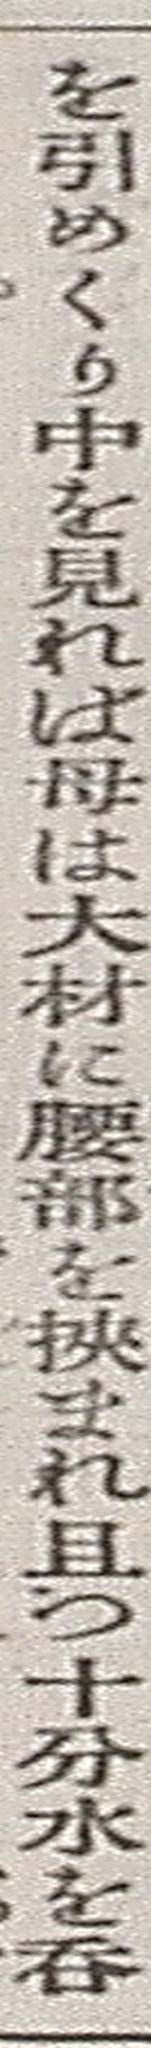を引めくり中を見れば母は大材に腰部を挟まれ且つ十分水を呑
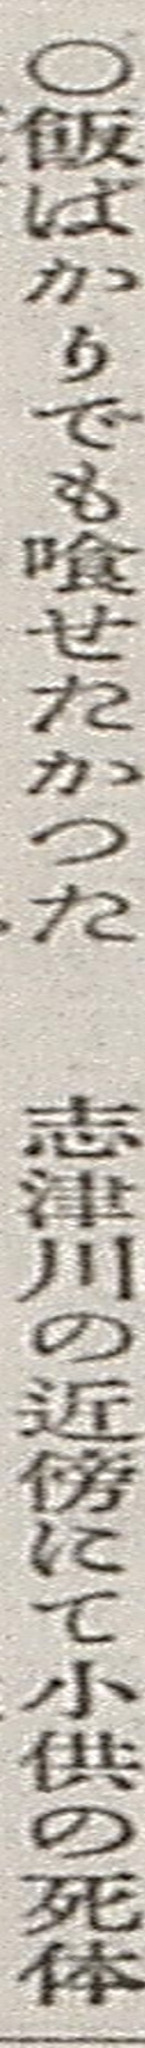○飯ばかりでも喰せたかつた志津川の近傍にて小供の死体
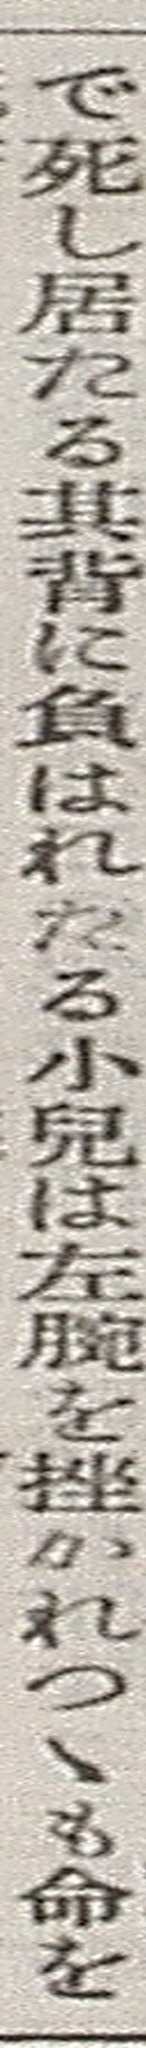で死し居たる其背に負はれたる小兒は左腕を挫かれつゝも命を
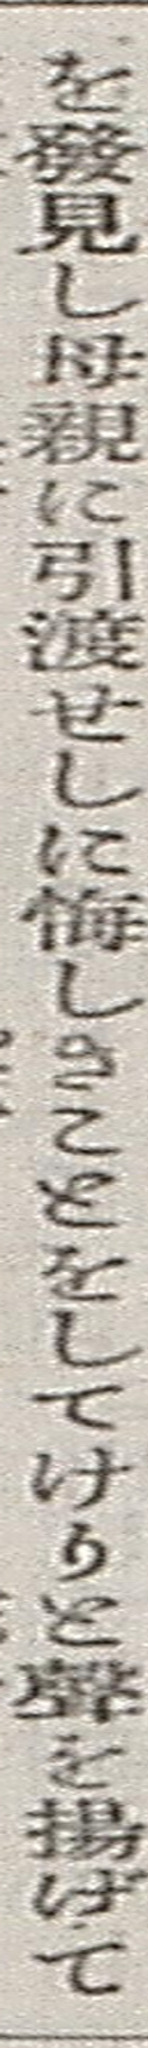を発見し母親に引渡せしに悔しきことをしてけりと声を揚げて
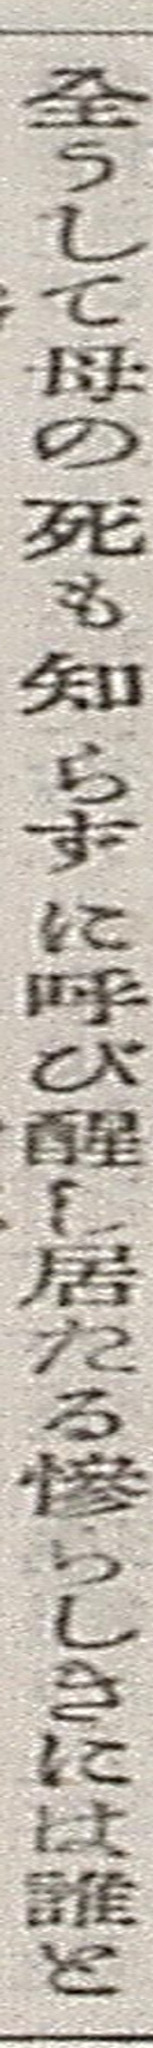全うして母の死も知らずに呼び醒し居たる惨らしきには誰と
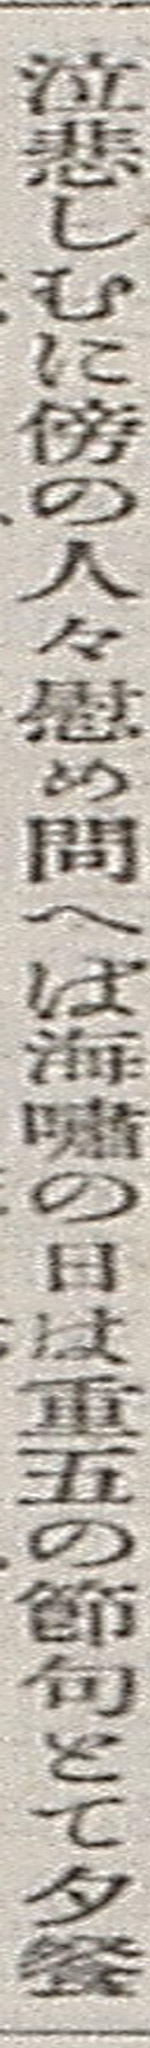泣悲しむに傍の人々慰め問へば海嘯の日は重五の節句とて夕餐
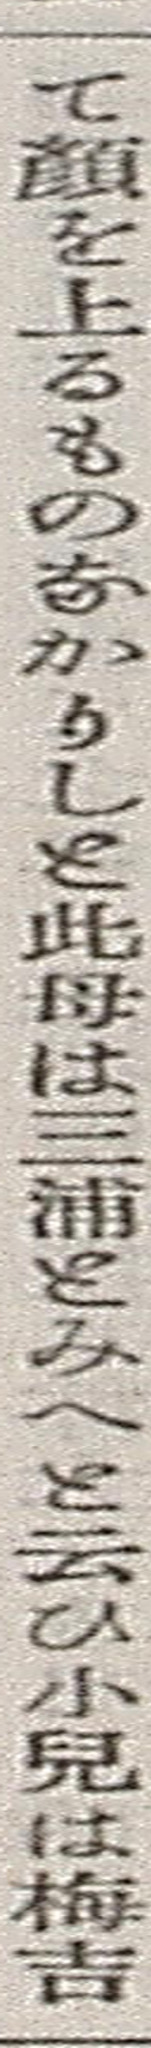て顏を上るものなかりしと此母は三浦とみへと云ひ小兒は梅吉
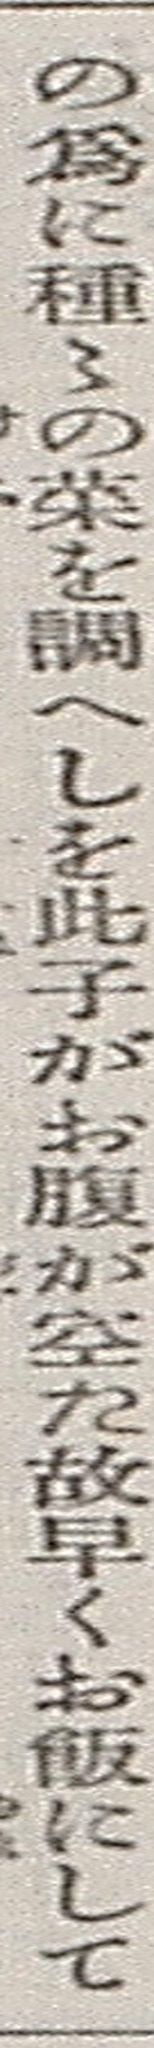の為に種〻の菜を調へしを此子がお腹が空た故早くお飯にして
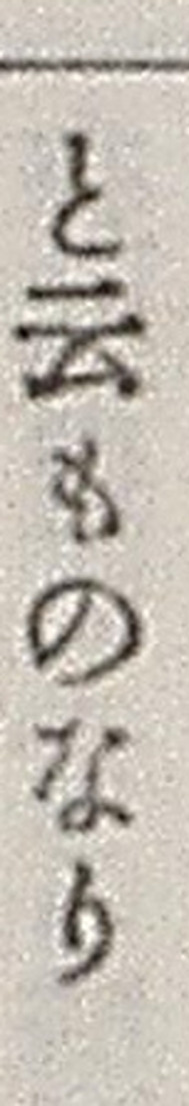と云ものなり
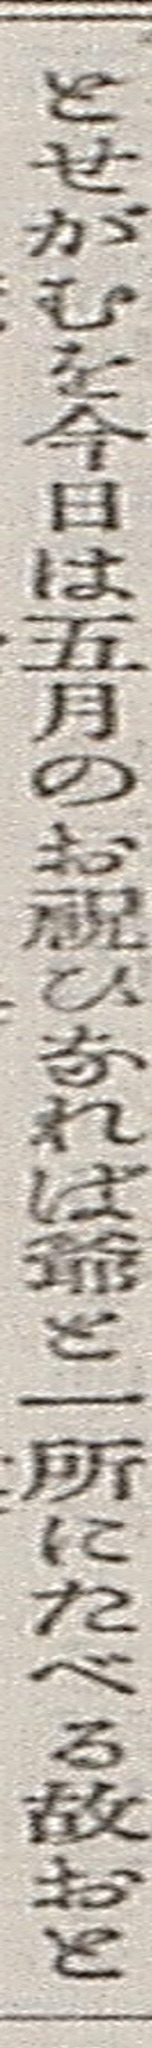とせがむを今日は五月のお祝ひなれば爺と一所にたべる故おと
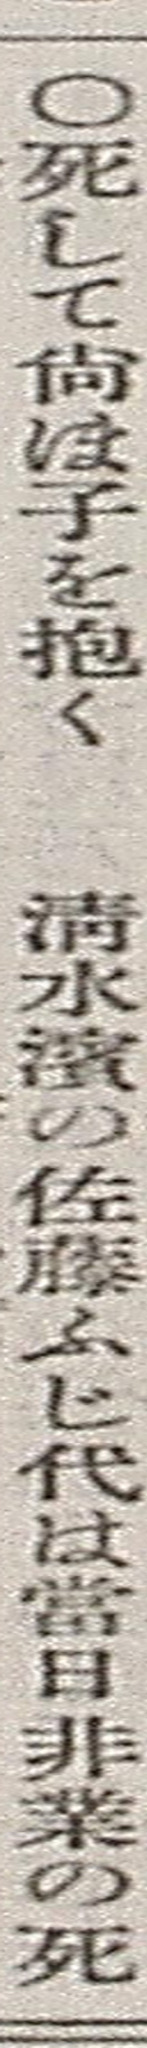○死して尚ほ子を抱く清水浜の佐藤ふじ代は当日非業の死
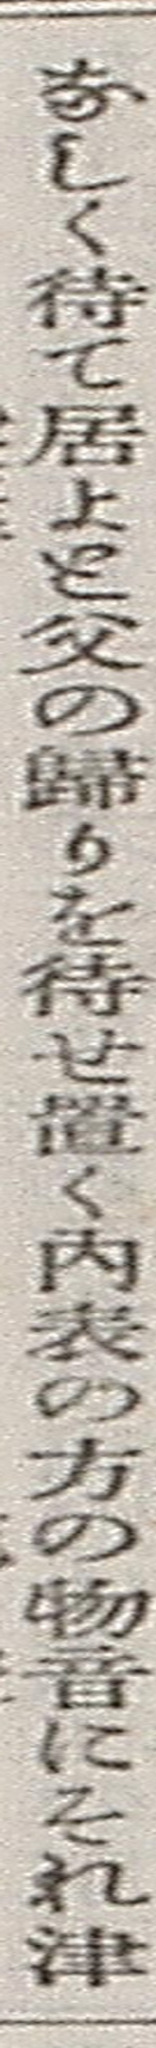なしく待て居よと父の帰りを待せ置く内表の方の物音にそれ津
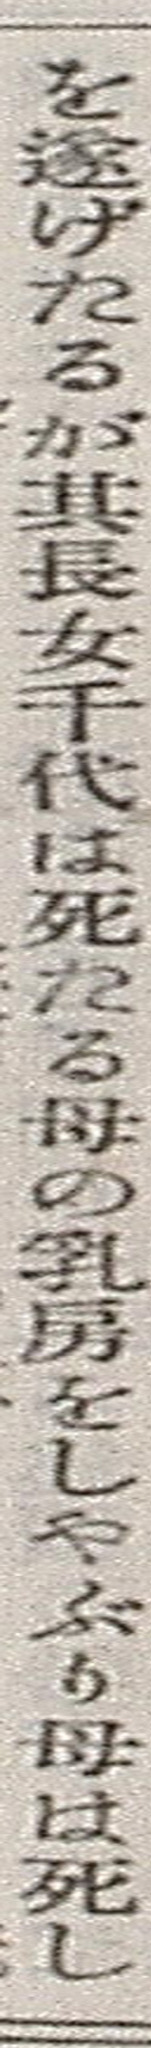を遂げたるが其長女千代は死たる母の乳房をしやぶり母は死し
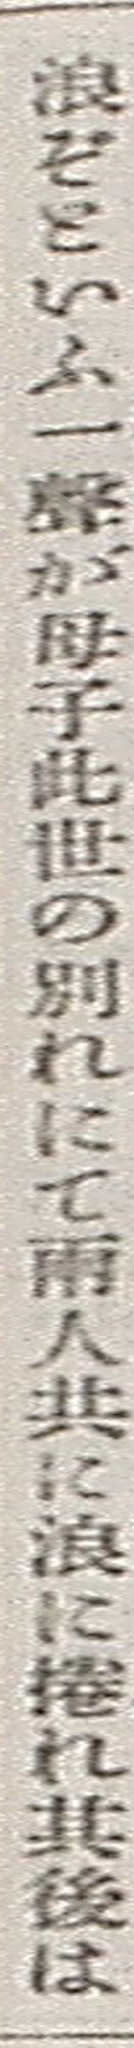浪ぞといふ一声が母子此世の別れにて両人共に浪に捲れ其後は
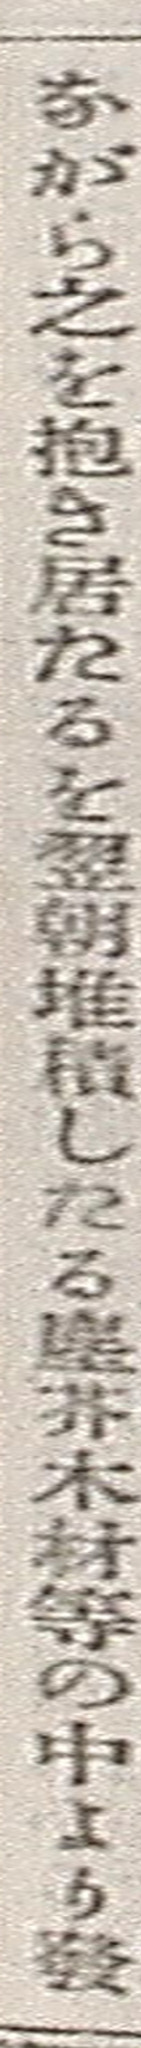ながら之を抱き居たるを翌朝堆積したる塵芥木材等の中より発
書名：風俗畫報臨時増刊第百二十號　大海嘯被害録（下）
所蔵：東京大学地震研究所図書室 Earthquake Research Institute Library, The University of Tokyo, JAPAN
